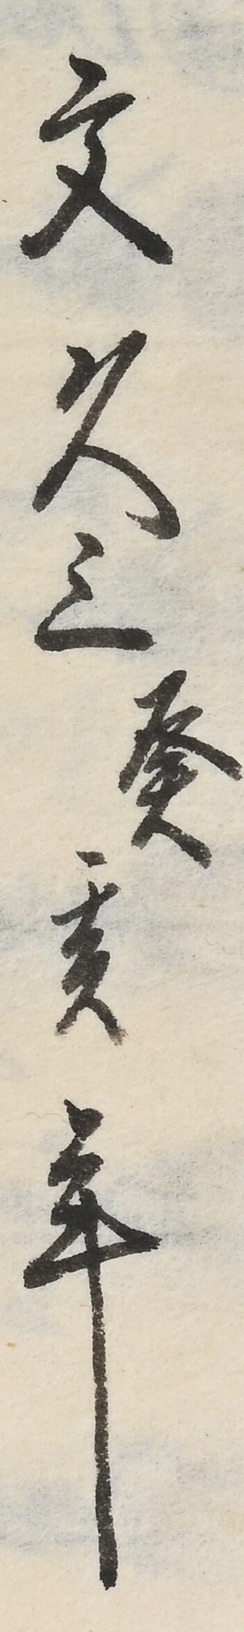文久三癸亥年
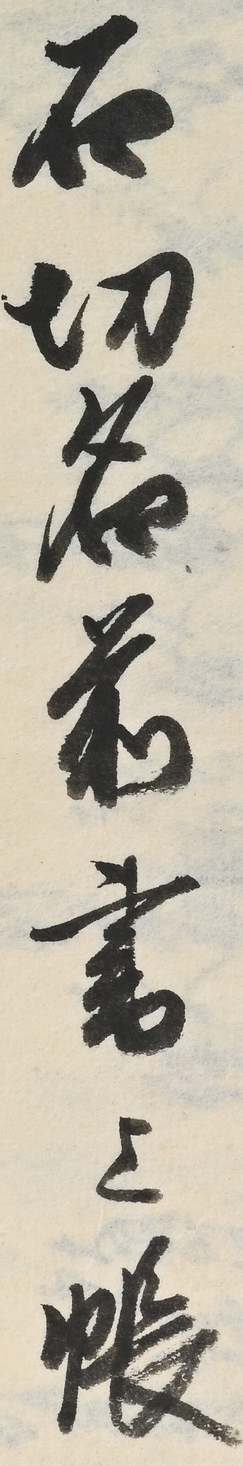石切名前書上帳
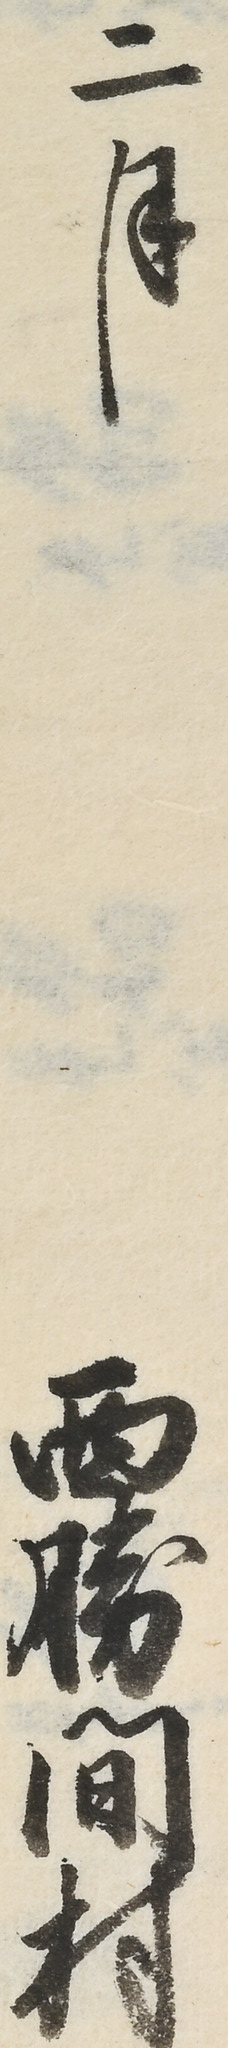二月西勝間村

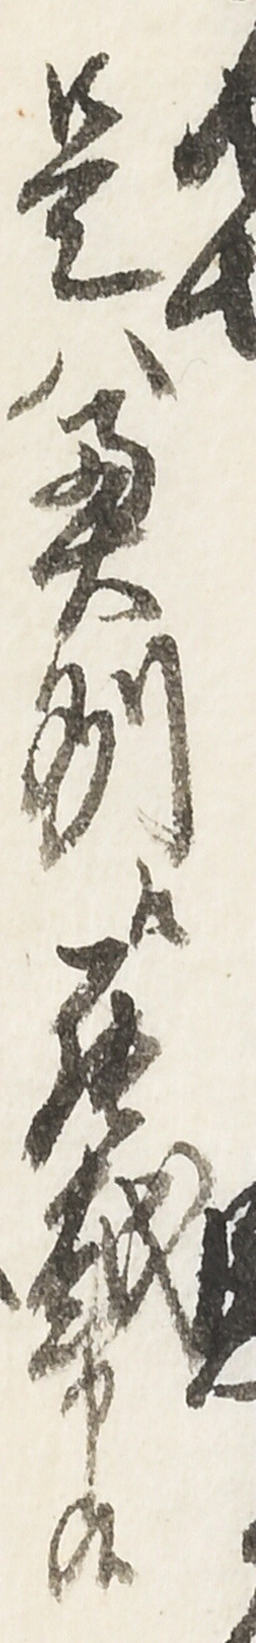是ハ奥州江罷越申候
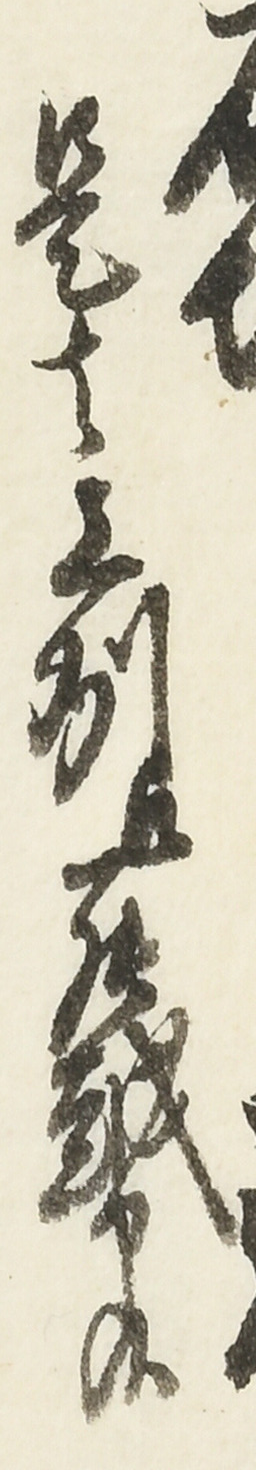是ハ上州江罷越申候

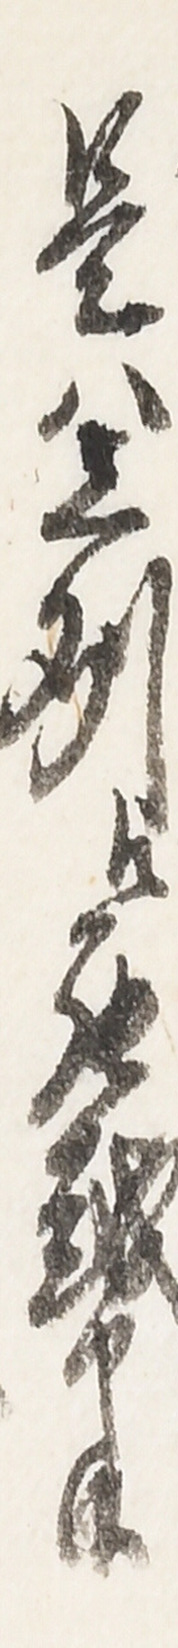是ハ上州江罷越申候
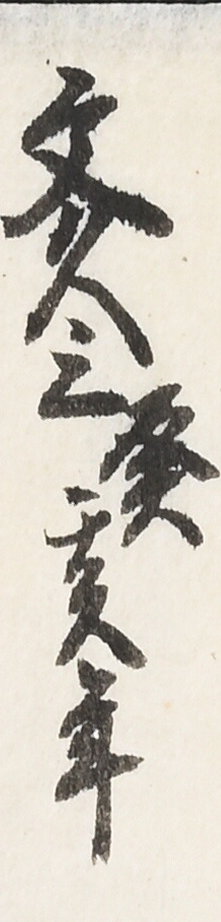文久三癸亥年
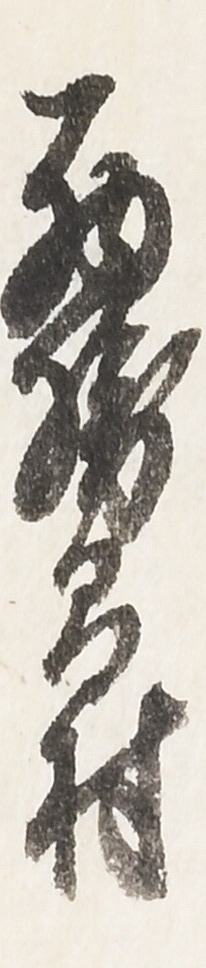西勝間村
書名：文久三癸亥年二月石切名前書上帳
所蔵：伊那市立高遠町図書館・合同会社AMANE
